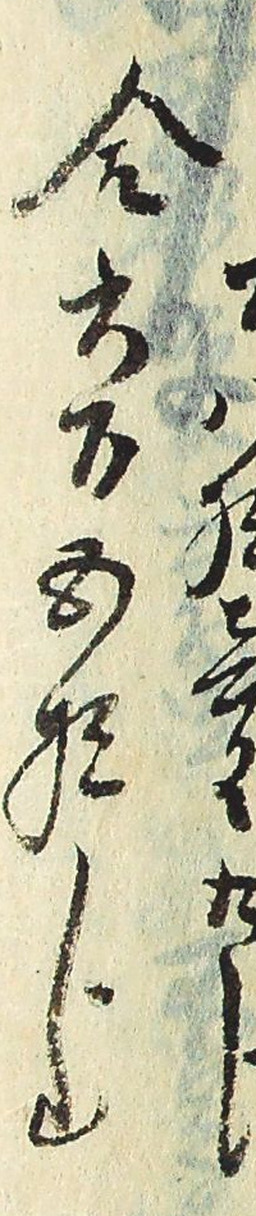合六百五拾匁

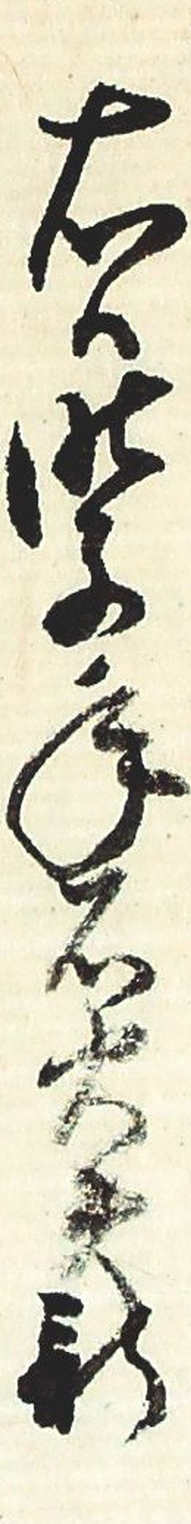右は昨子年石火矢新
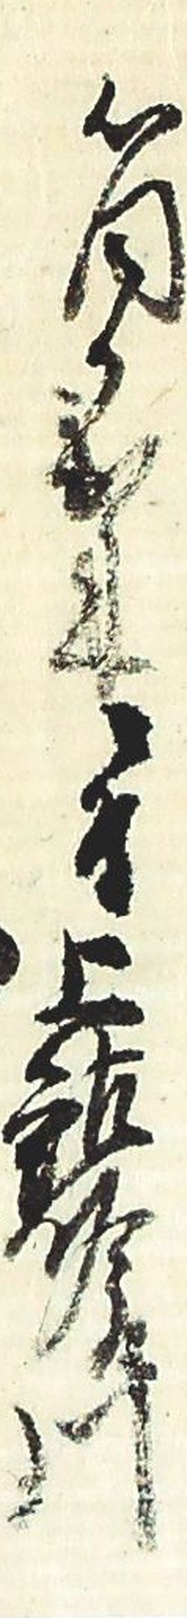筒御出来に付上鮎喰川
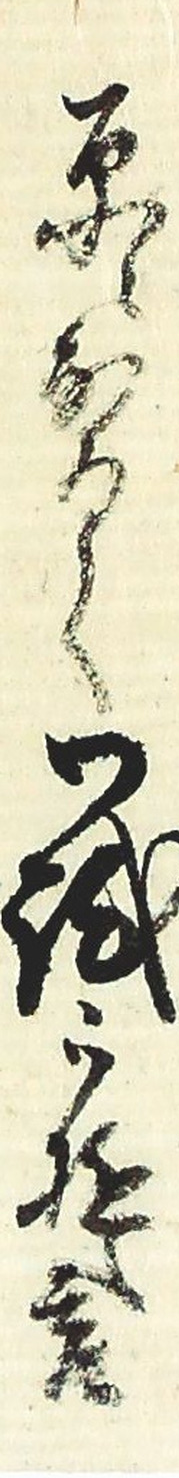原におゐて御試被遊候節
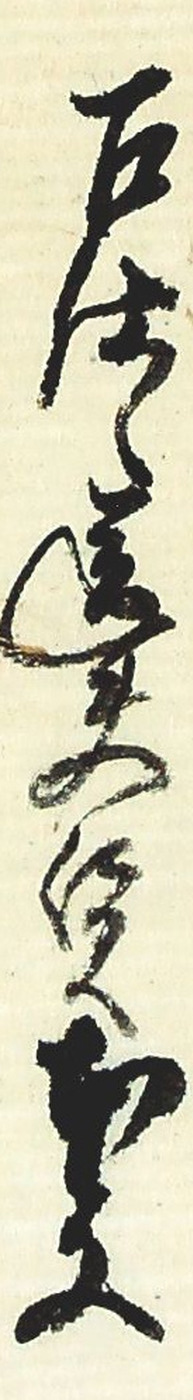召仕候送夫賃本文
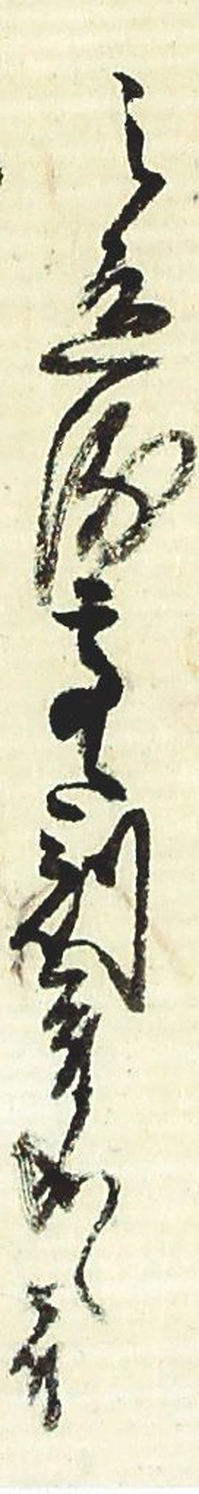之通持高に割苻出候に付
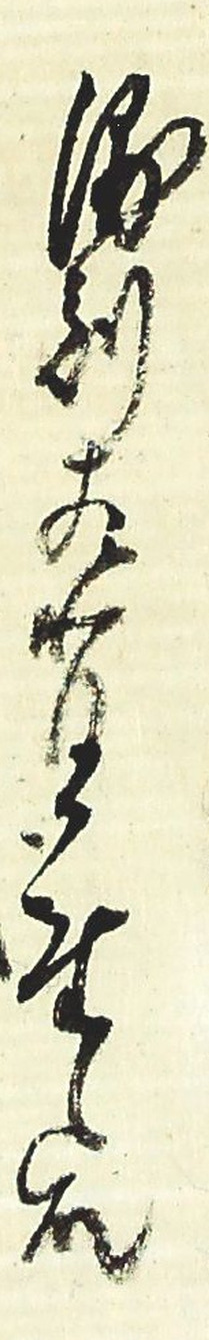例割相背御座候故
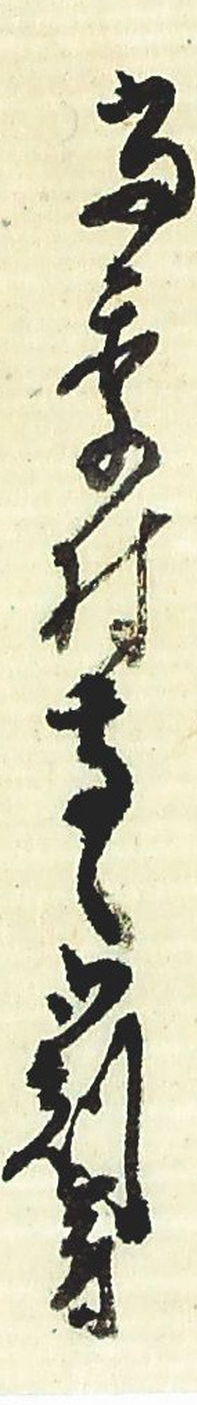当季村高へ御割苻
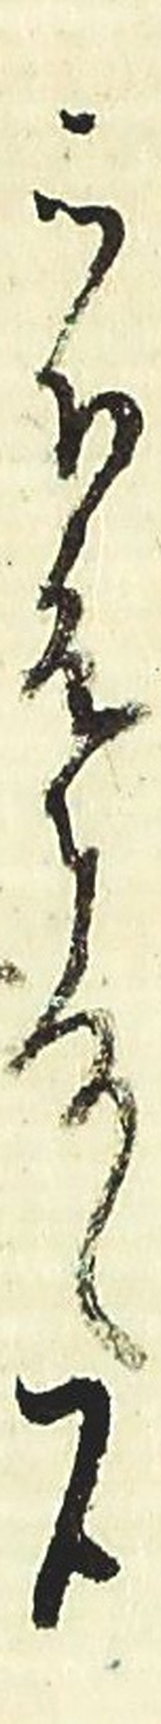被下度奉存候以上
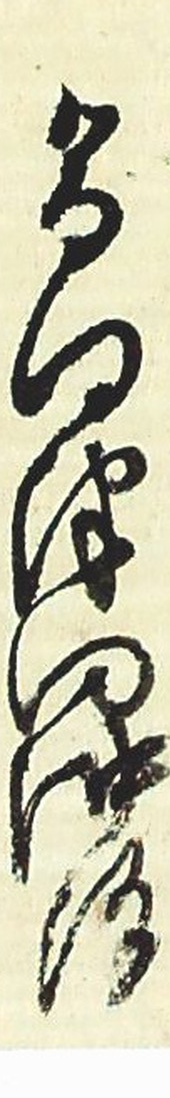冨田津田沖洲
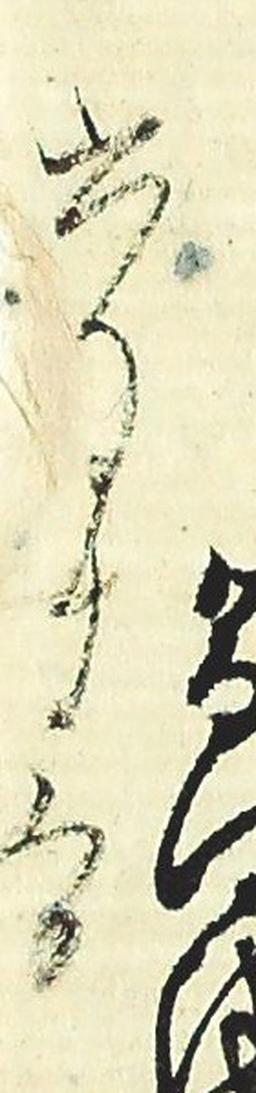六月十三日

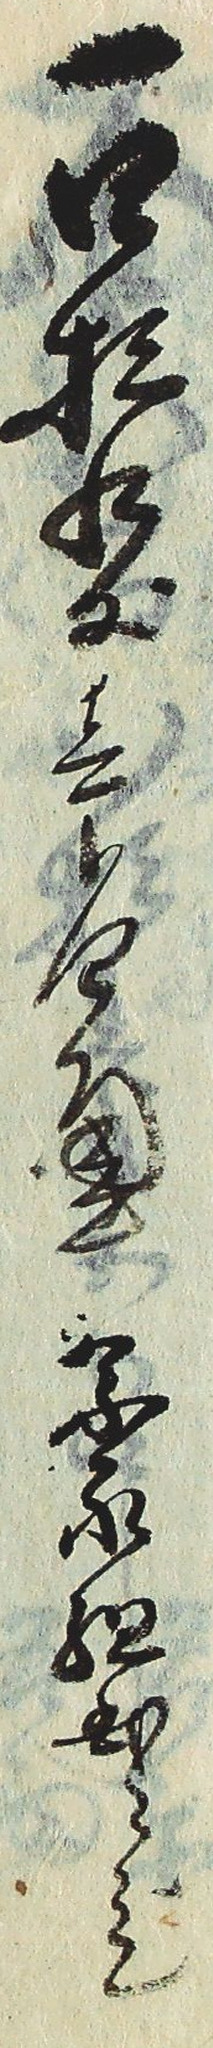一四拾九匁壱分四厘富永組当り迄
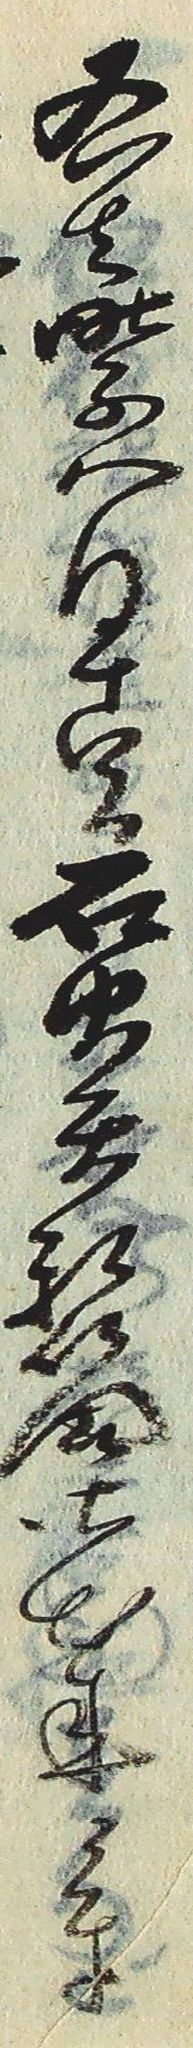右は昨子八月十四日石火矢新筒御出来に付
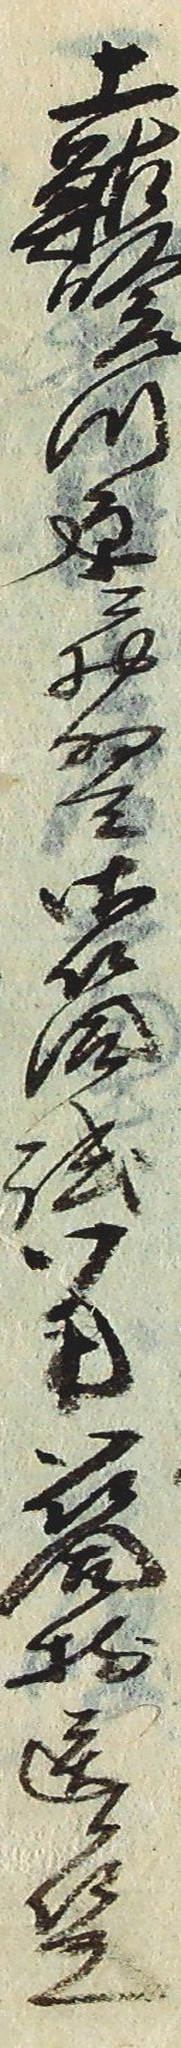上鮎喰川原におゐて御筒試御用御筒持送り賃
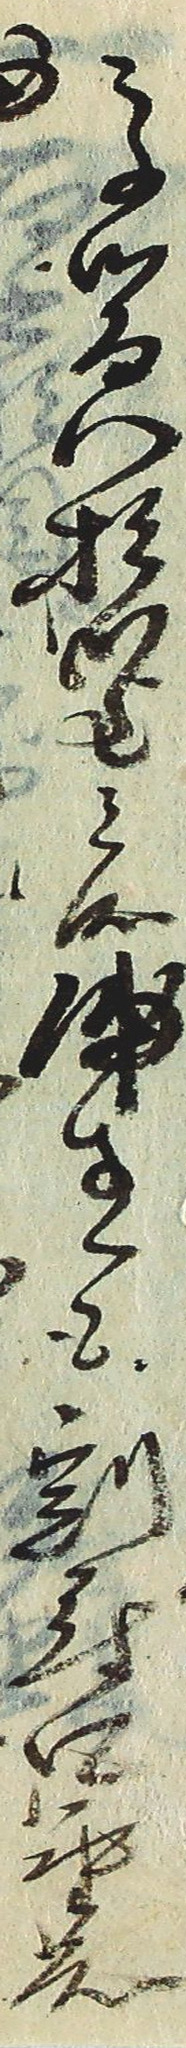高弐百八拾弐匁之所浦方へも割苻御座候所
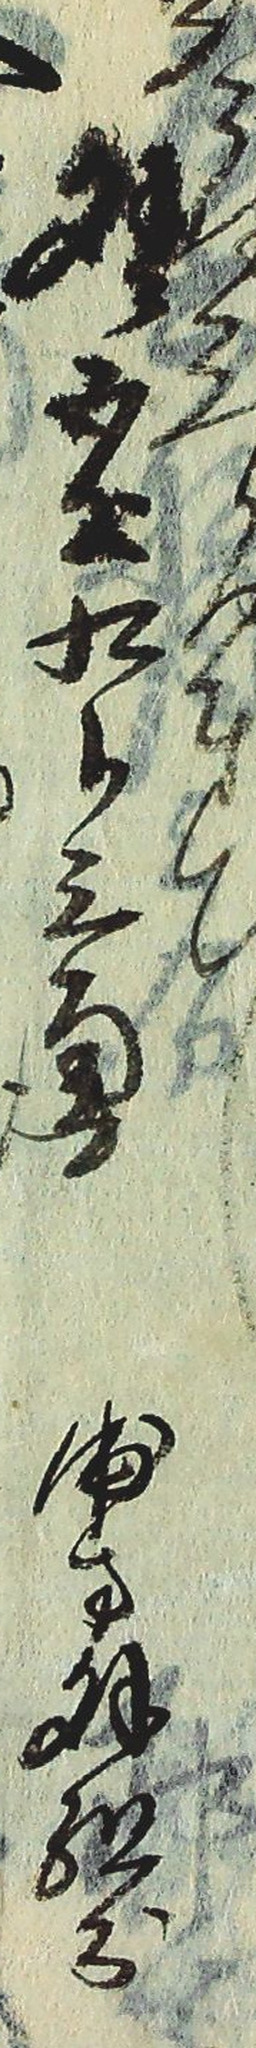外に五匁九分三厘浦方外組分
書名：名東郡中諸割賦元帳
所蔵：鳴門教育大学 Naruto University of Education
